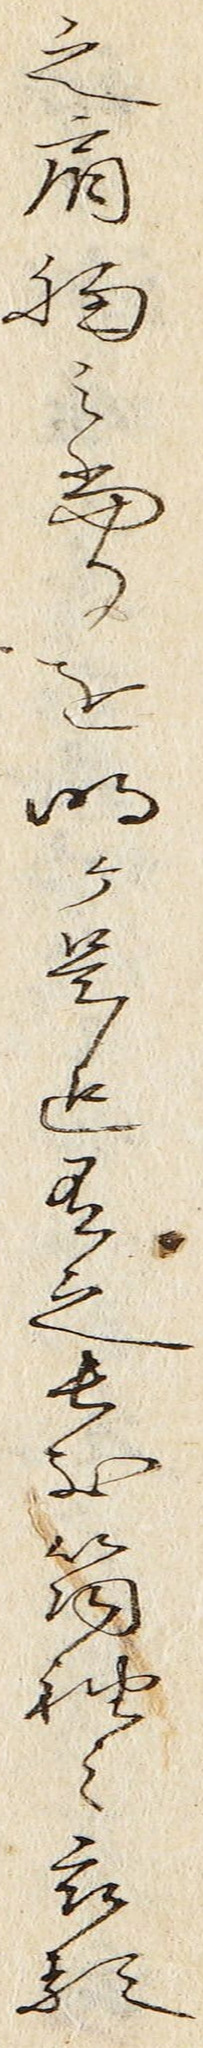之肩胸之当りを明け是迄有之長き筒袖之衣類
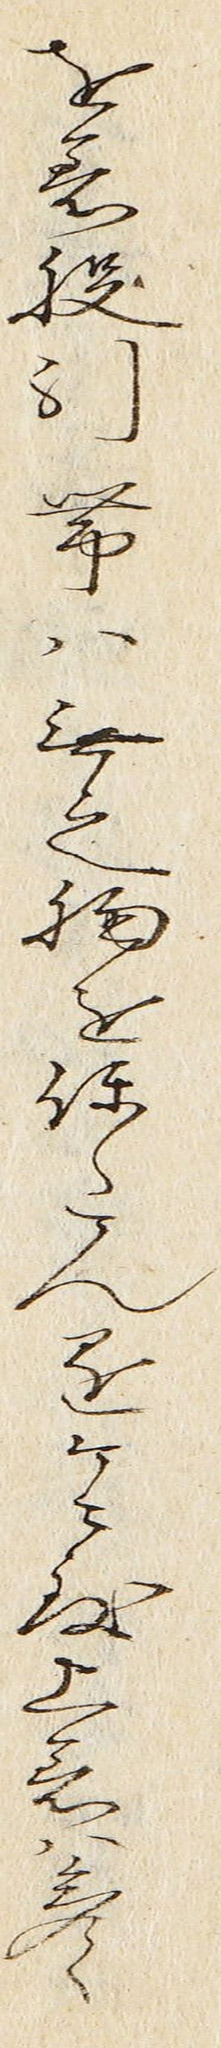を着股引帯は無之胸をほたん懸ヶに致上着は多く
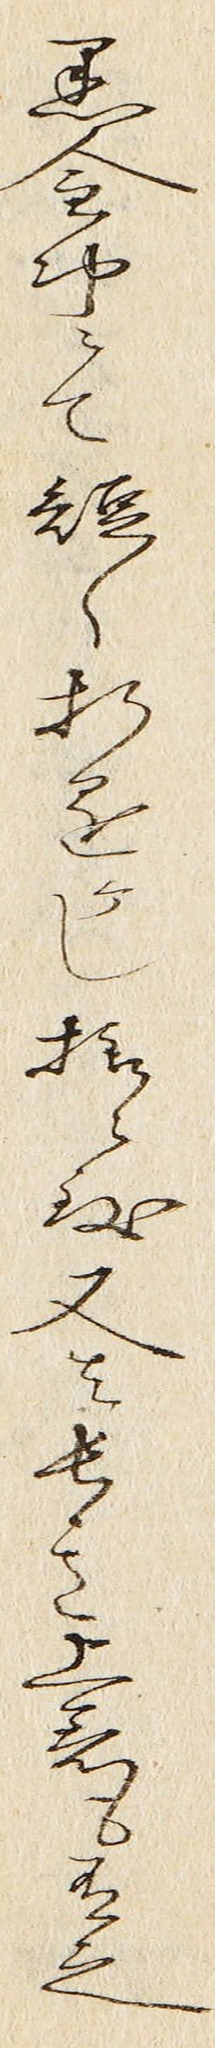黒金巾にて短く折懸ヶし様に致又は長き上着も有之
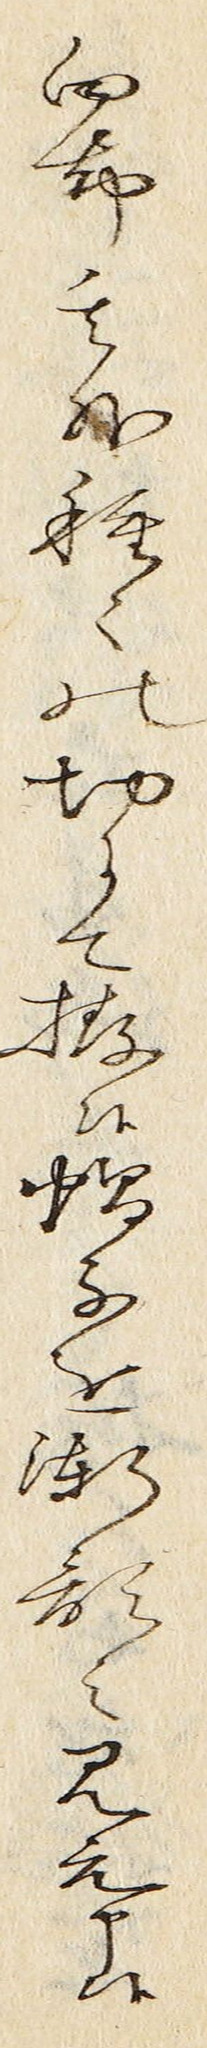白巾其外種々の切にて拵候帽子を漸顔之見え申候
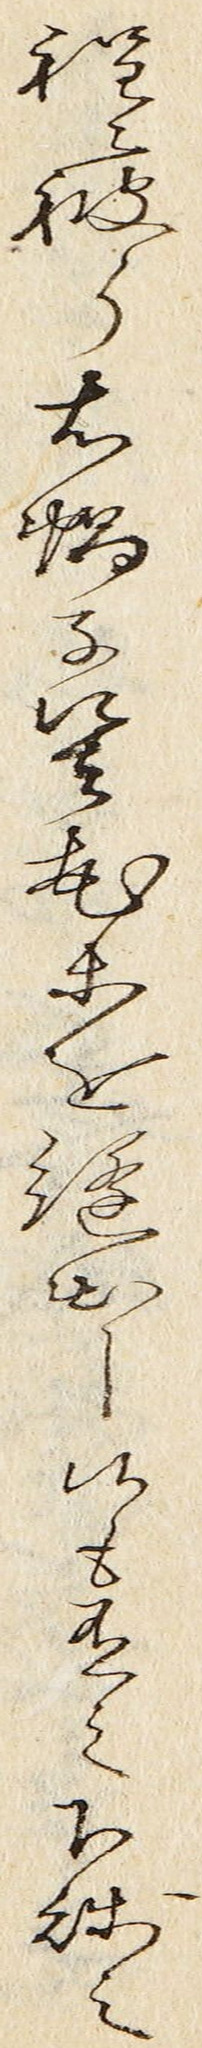程に被り右帽子には花等を縫出し候も有之下賤之
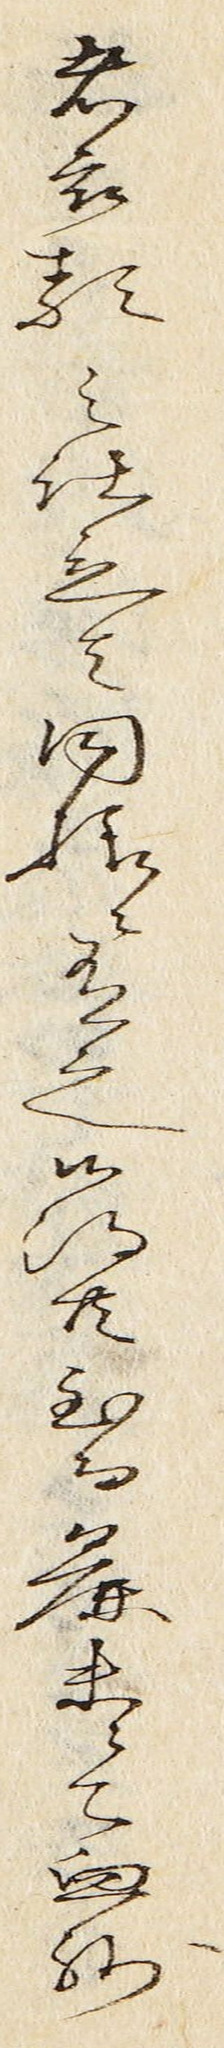者衣類之仕立は同様に有之候得共至而麁末にて皿紗
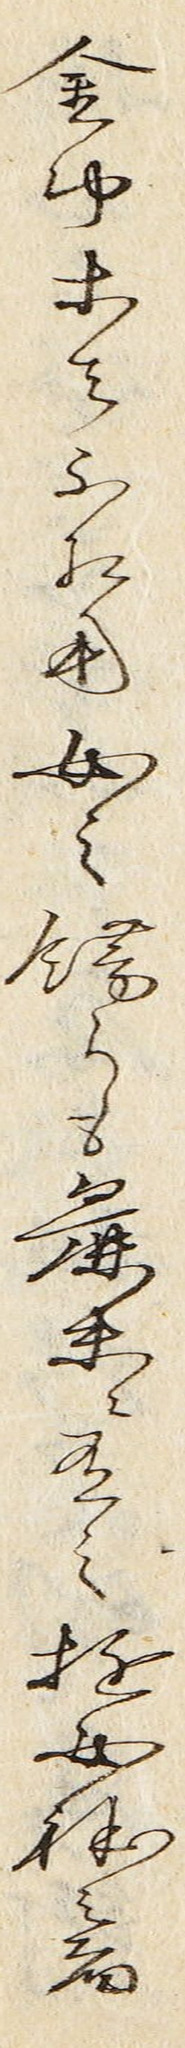金巾等は不相用女之飾りも麁末に有之遊女躰之者
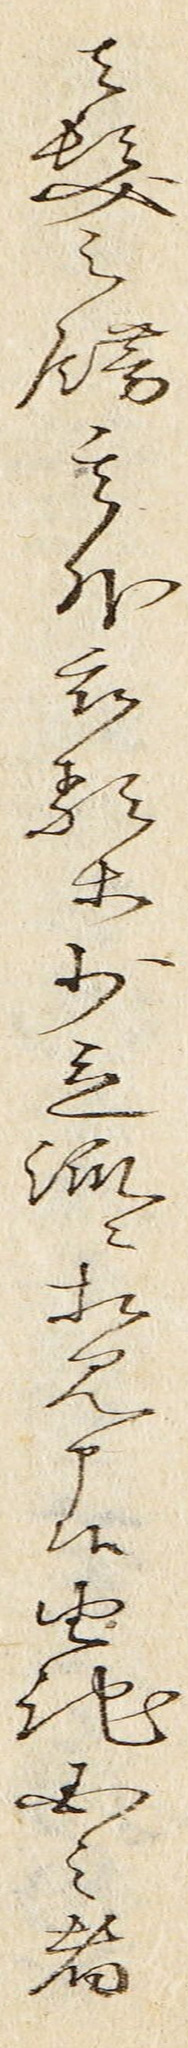は髪之錺其外衣類等少立派に相見申候由他国之者
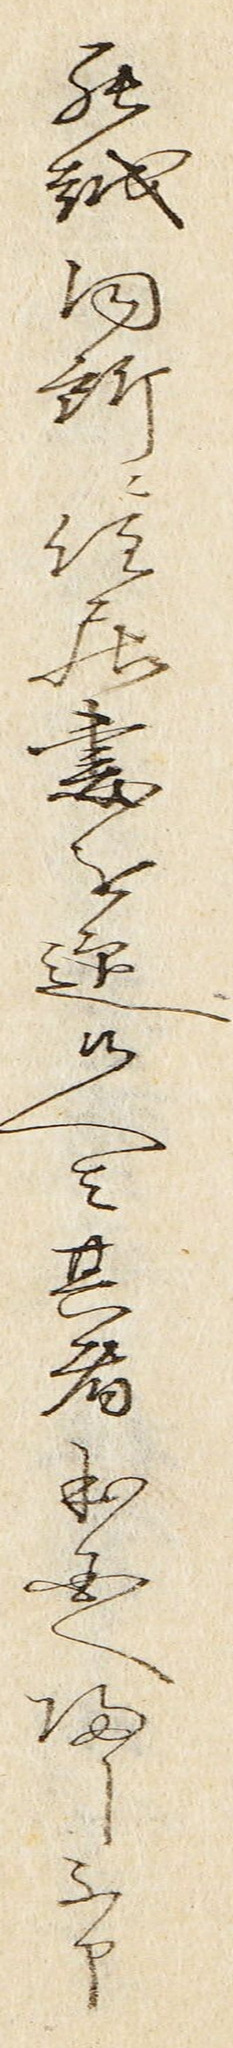罷越同所に住居妻を迎候へは其者本国へ帰し不申
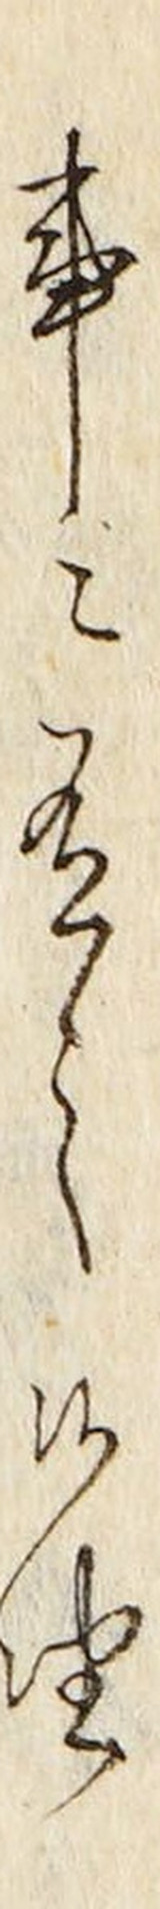事に有之候由
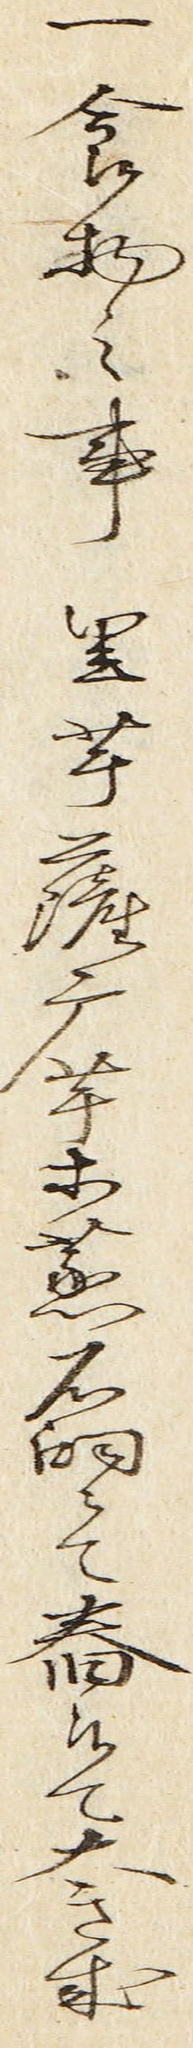一食物之事里芋薩摩芋等相蒸石臼にて𣇃候て大き成
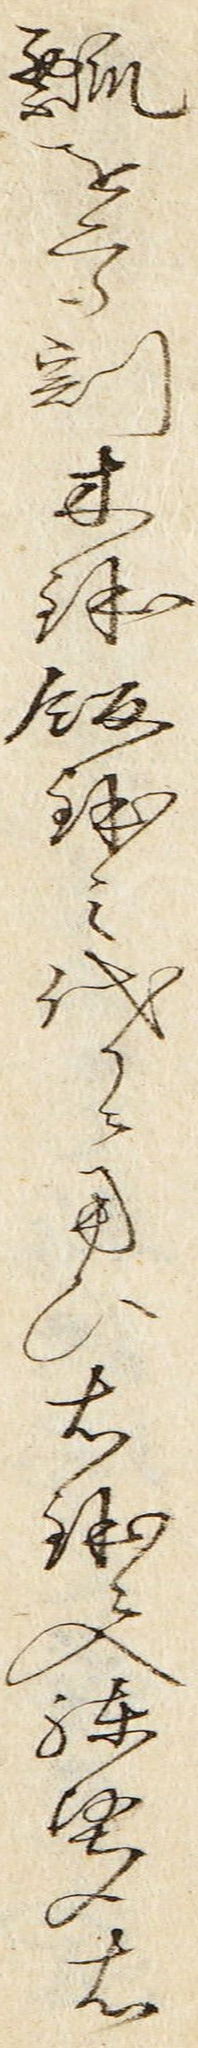瓢を二ッ割木鉢飯鉢之代りに用ひ右鉢に入練堅メ右
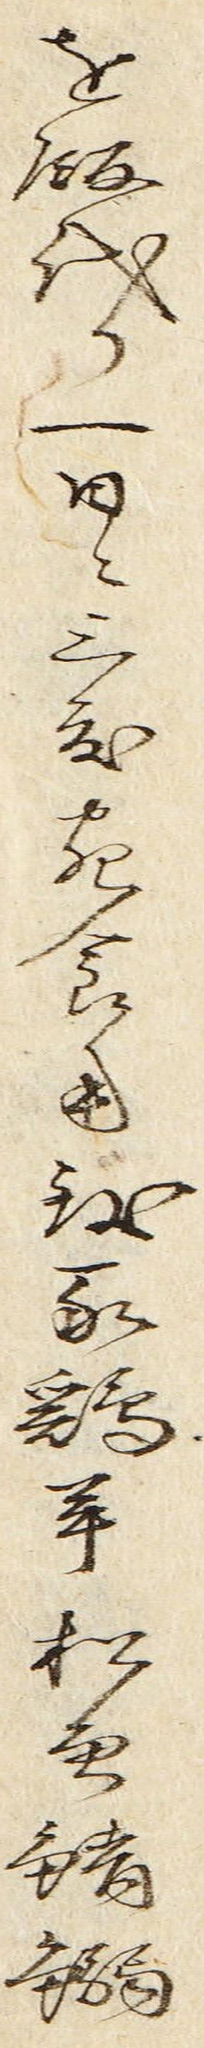を飯代り一日に三度宛食用致豕鶏羊松魚鯖鰯

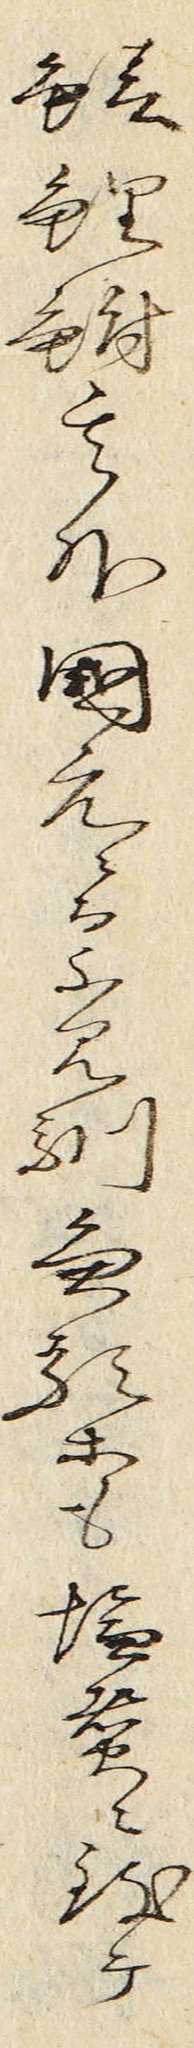鰆鯉鮒其外国元に而不見馴魚類等も塩煮に致て
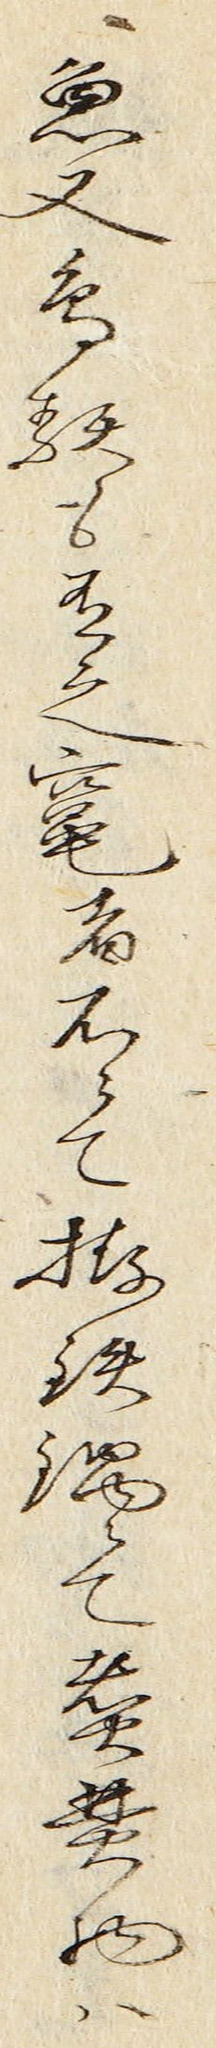魚又鳥類も有之竃は石にて拵鉄鍋にて煮費物は
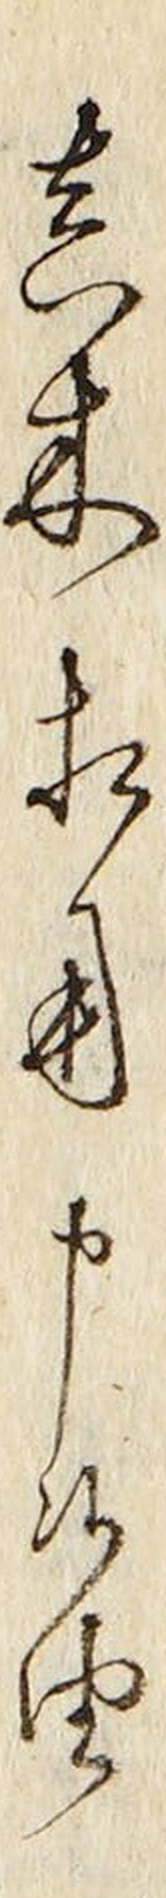真木相用申候由
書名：土佐中浜万次郎漂流記
